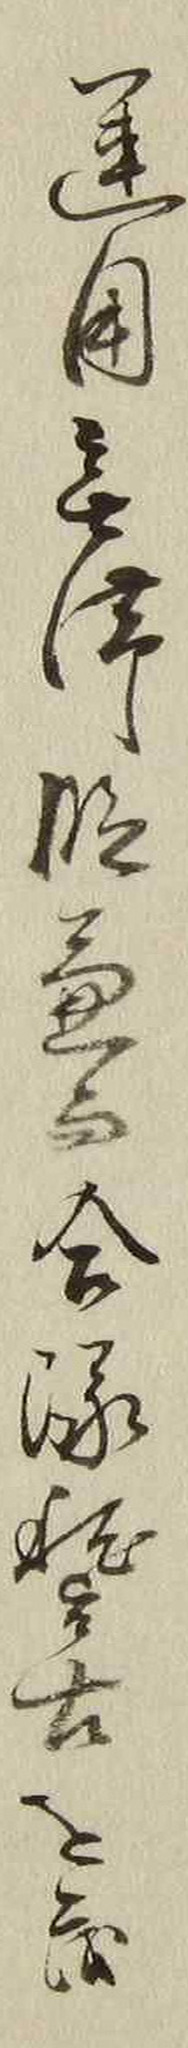運用無滞段兼而合隊稽古をも
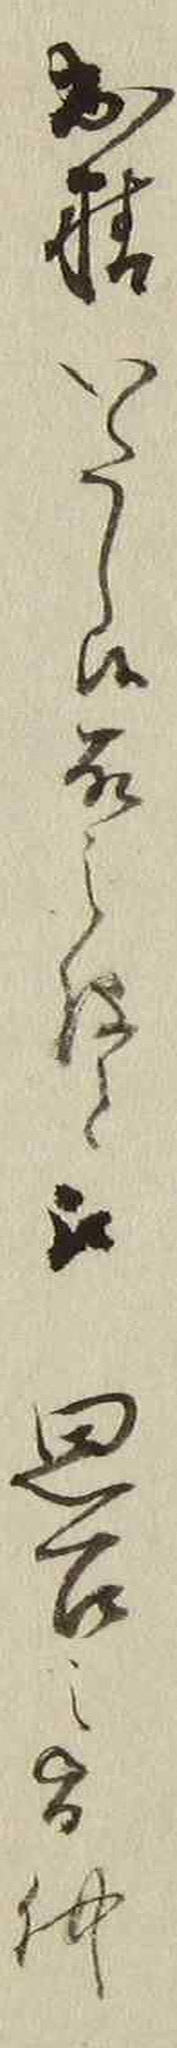出精いたし候故之儀と被思召之旨仲
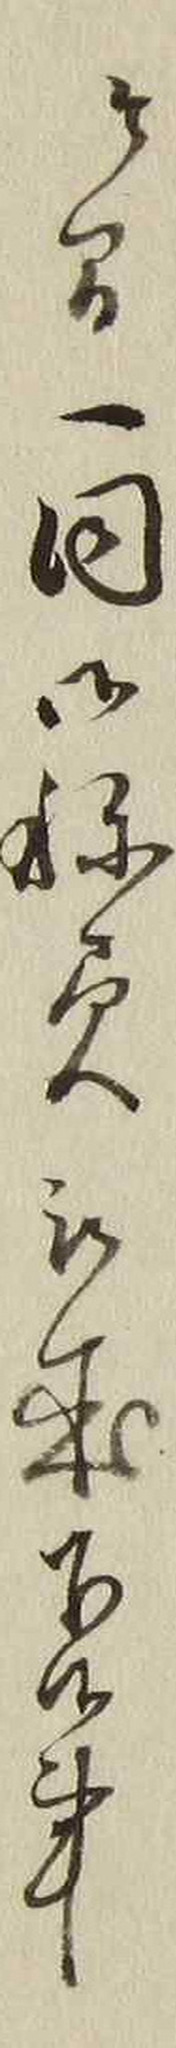ヶ間一同御称美被成下候事
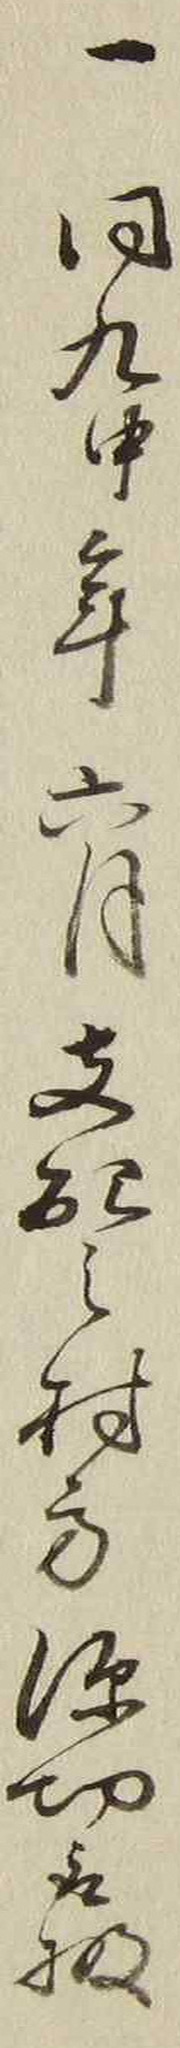一同九申年六月支配之村方深切取扱
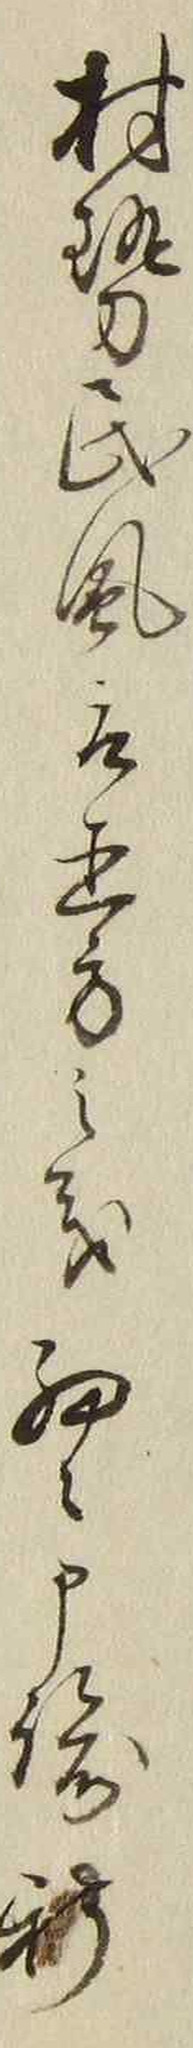村勢民風取直方之義細々申諭新
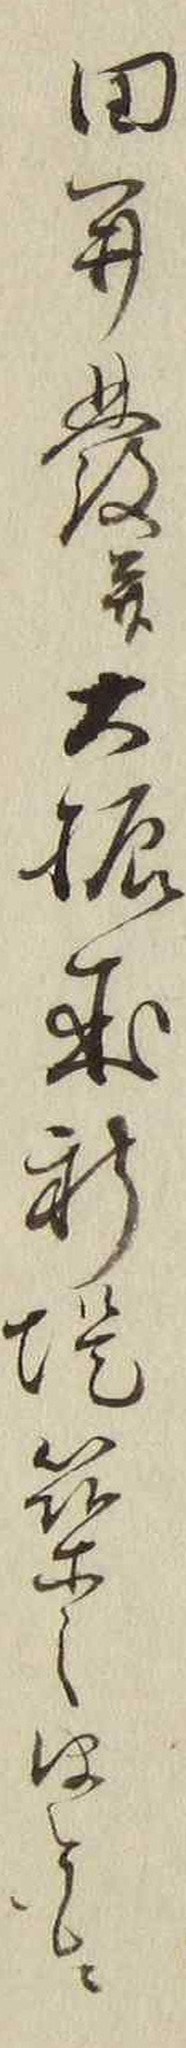田開発幷大振成新堤築之儀ともニ
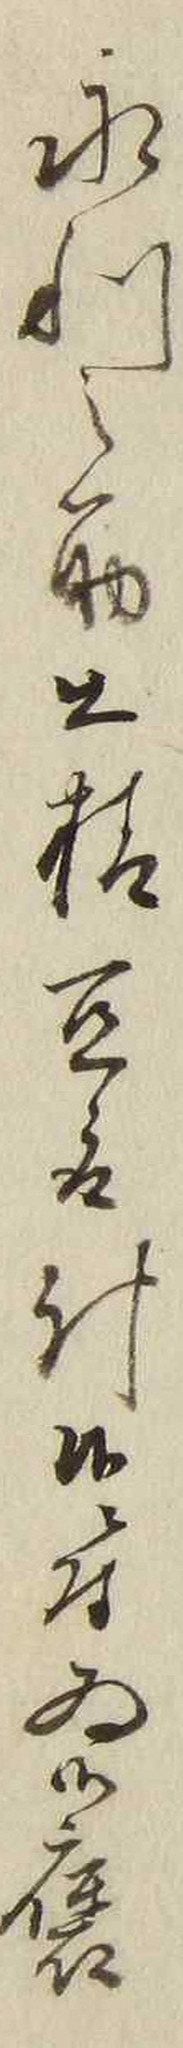永利之筋出精宜取計候ニ付為御褒

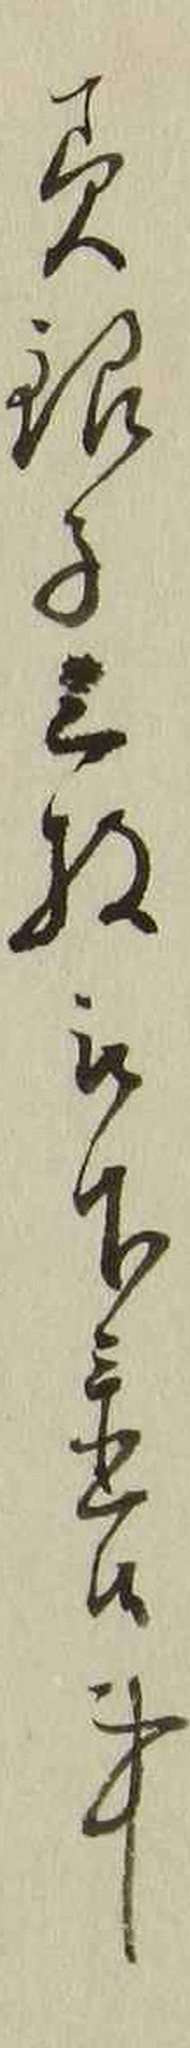美銀子三枚被下置候事
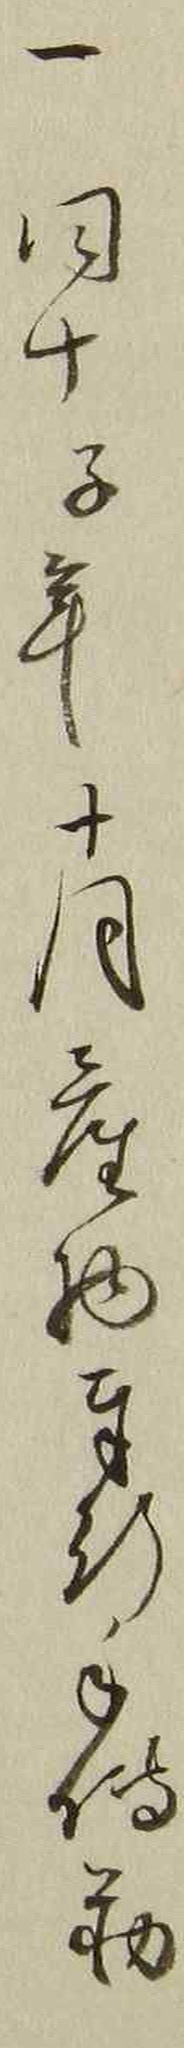一同十子年十月産物奉行手伝勤
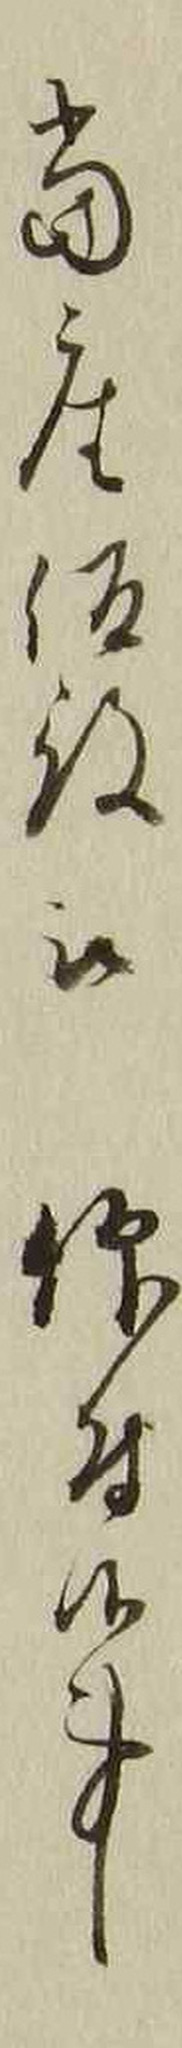当座仮役被仰付候事
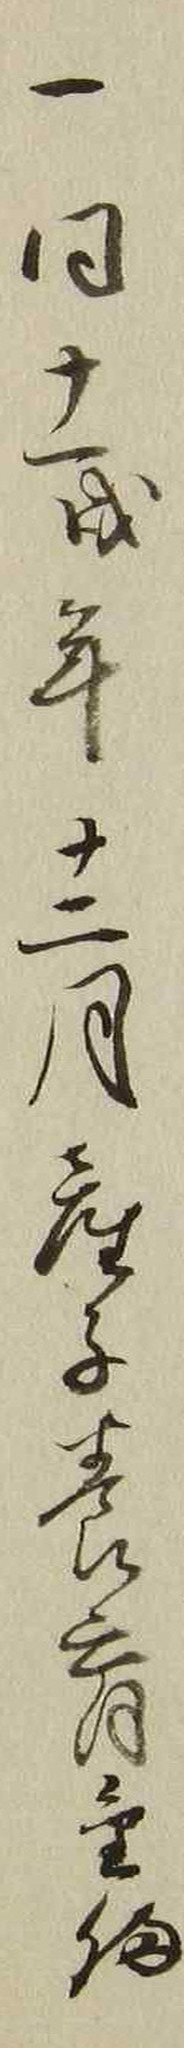一同十一戌年十二月産子養育金備
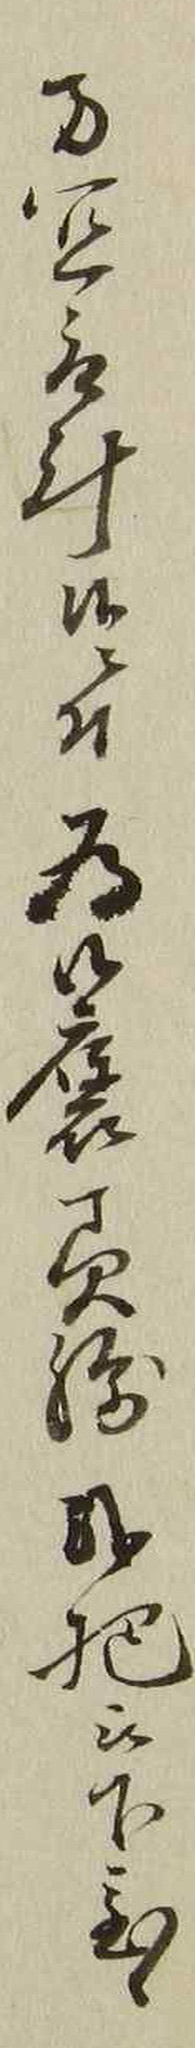方宜取計候ニ付為御褒美綿弐把被下置候
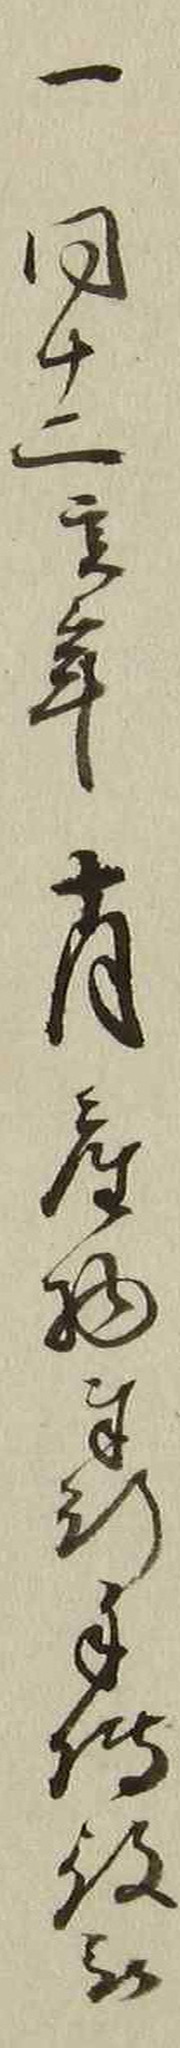一同十二亥年十月産物奉行手伝役被
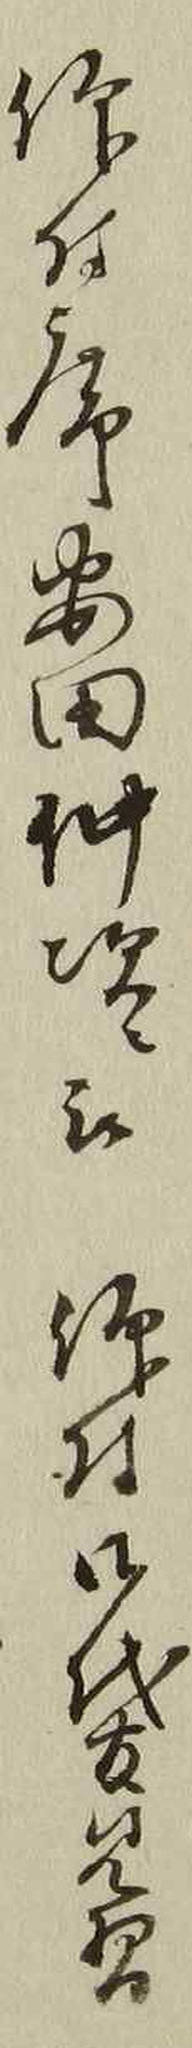仰付席安田仲次ニ被仰付御代官見習
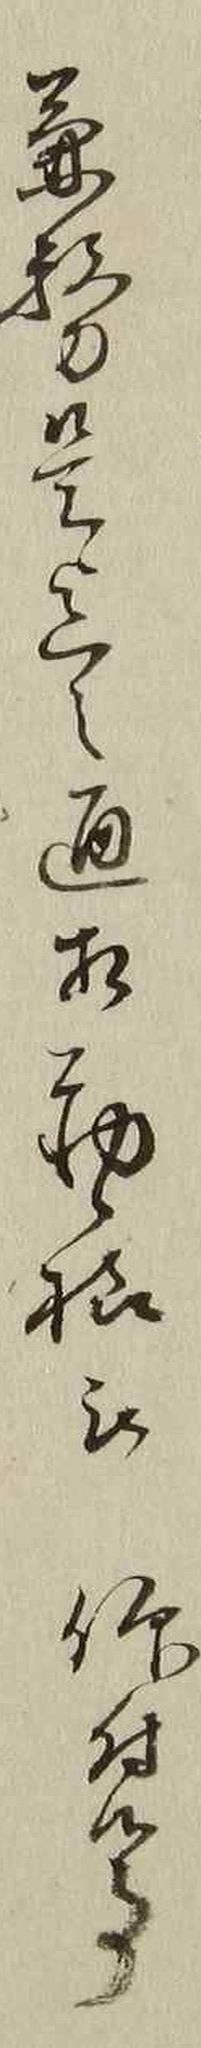兼務是迄之通相勤候様被仰付候事
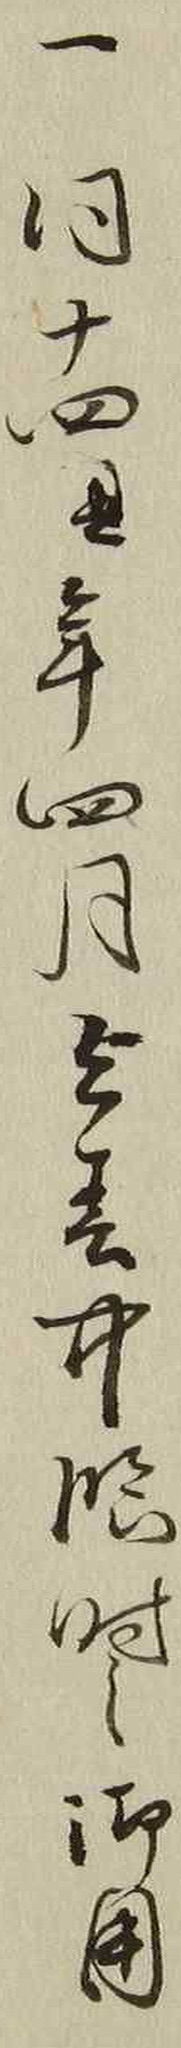一同十四丑年四月迄春中臨時之御用
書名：諸士系譜　巻之129　た之部5
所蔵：会津若松市立会津図書館
